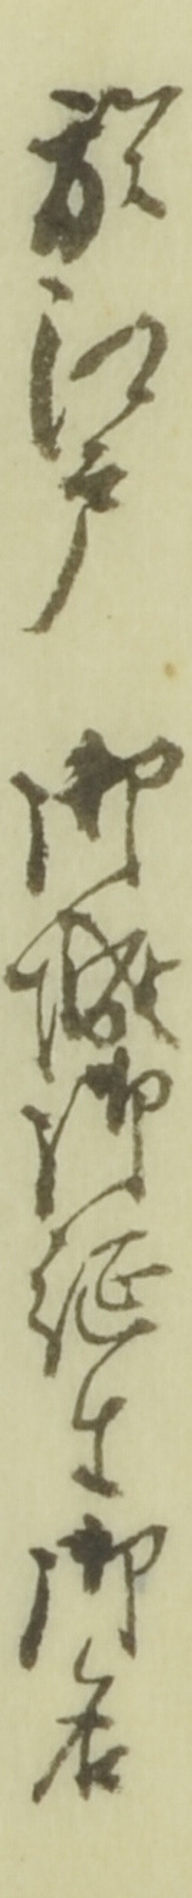於江戸御城御誕生御名
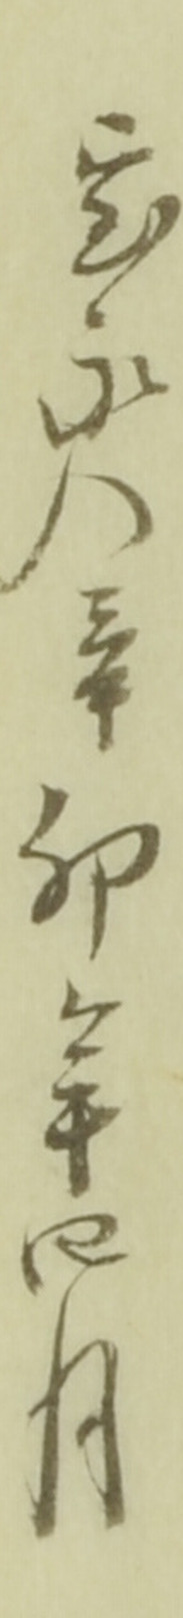宝永八辛卯年四月
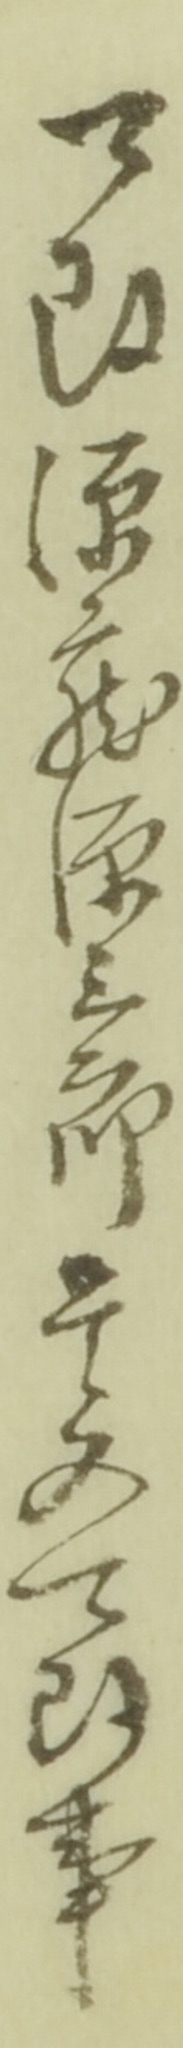可改源蔵源三郎是又可改事
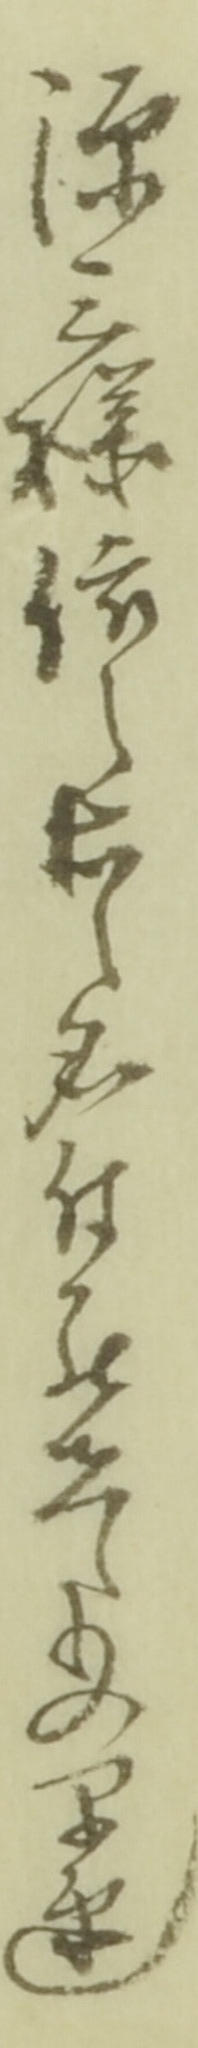源三様依之右之名付罷在候もの早速
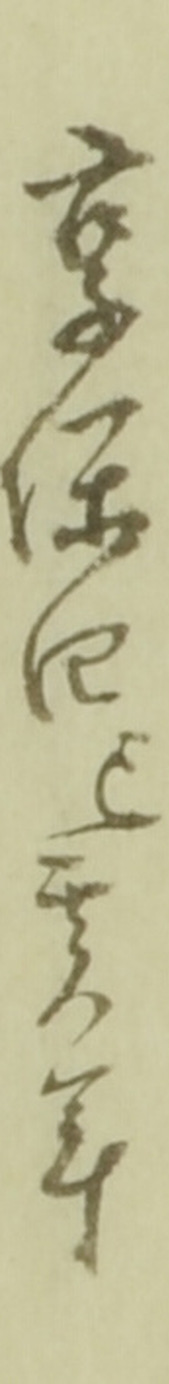享保四己亥年
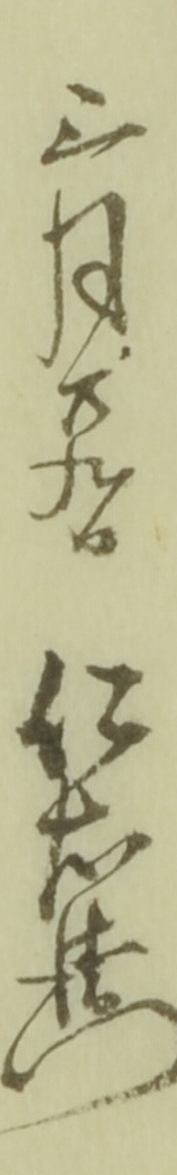三月二十九日仁右衛門
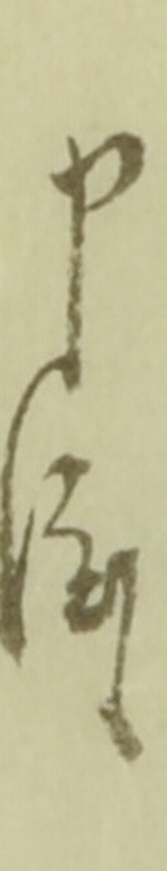申渡候
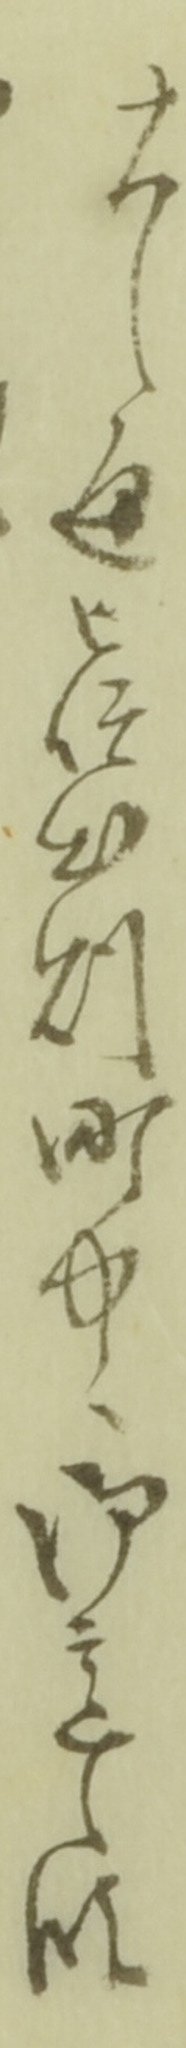右之通被仰出則町中へ御意之段
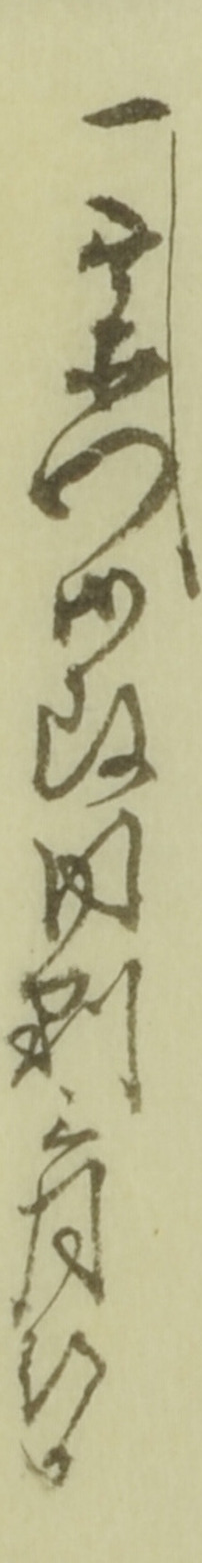一宗門御改内判三月朔日
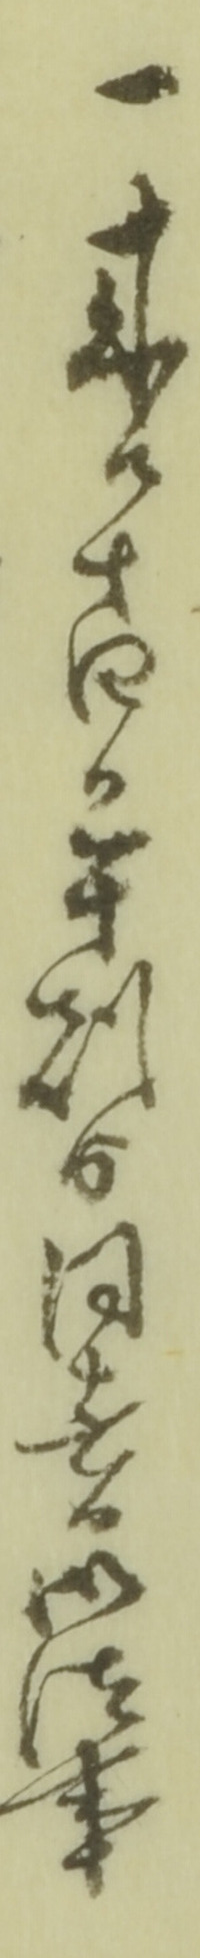一来ル十四日午刻ゟ同十七日御法事
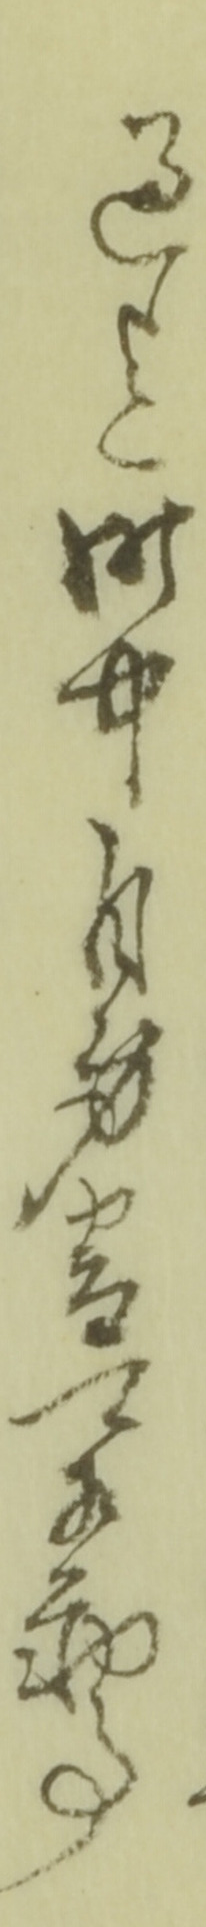過候迄町中自身番可相勤事
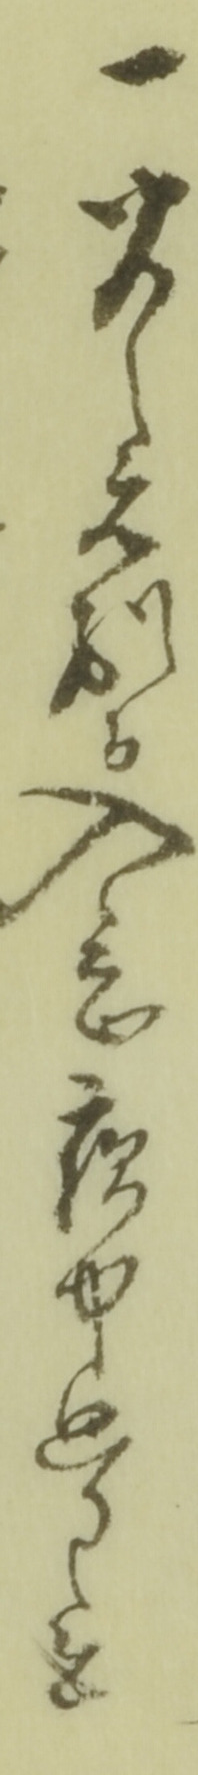一火之元別而入念夜中廻り之者
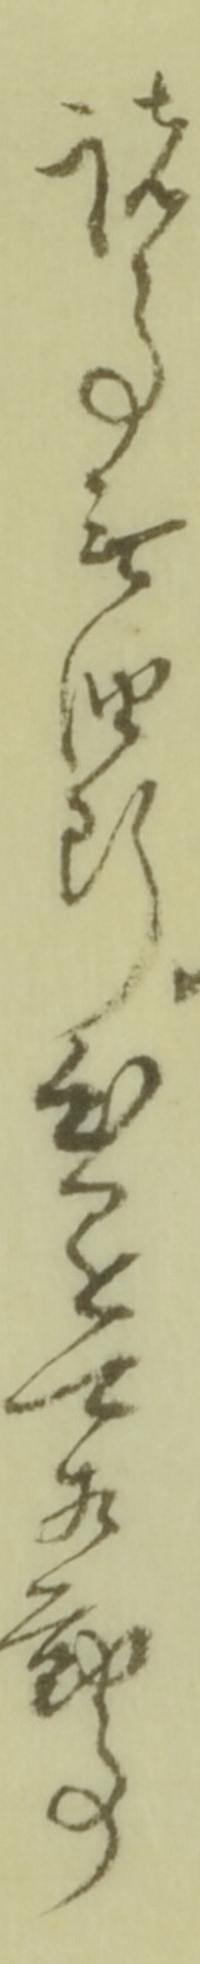諸事無油断心懸可相勤事
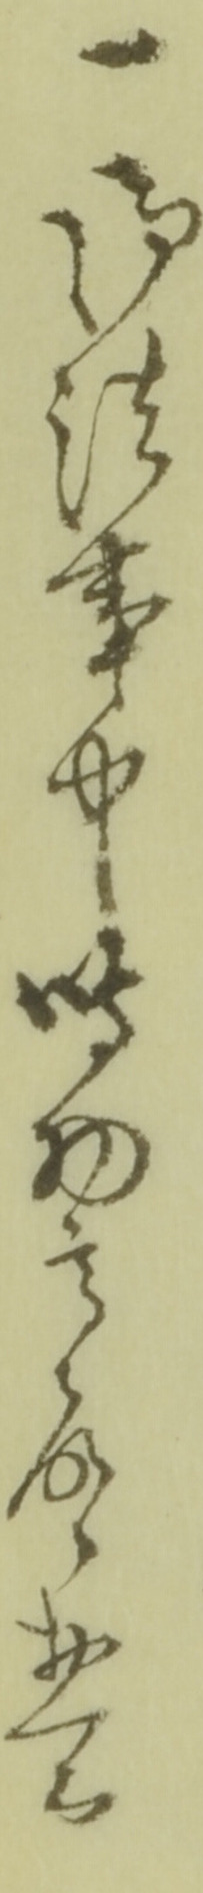一御法事中鳴物高声惣而
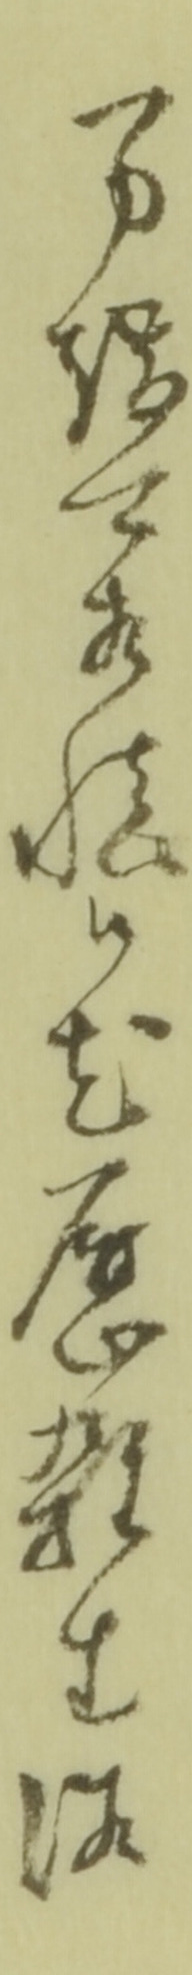万端可相慎候尤屠中殺生類
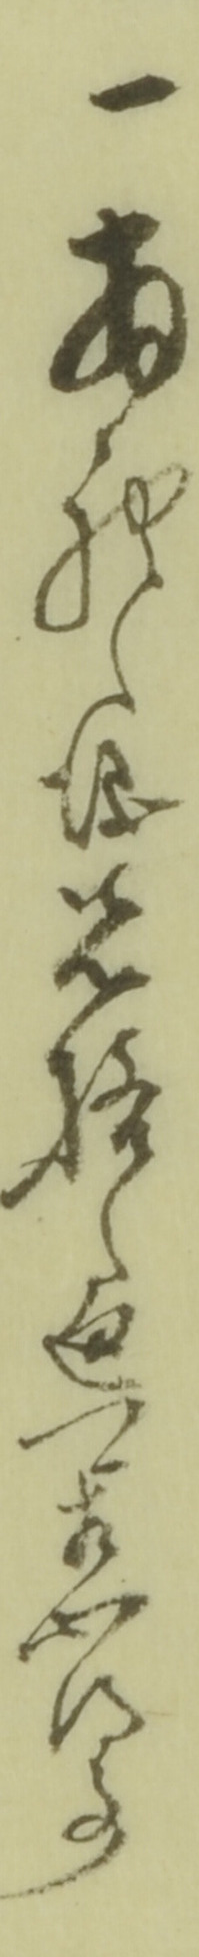一拝礼之儀先格之通可相心得事
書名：御公儀様御領主様御触書控
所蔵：伊那市立高遠町図書館・合同会社AMANE
